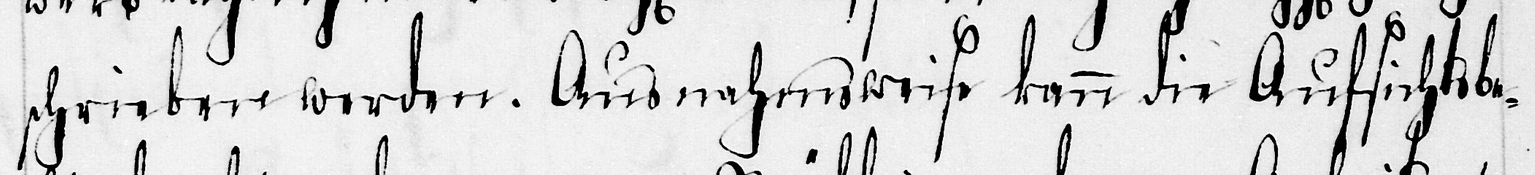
schrieben werden. Ausnahmsweise kann die Aufsichtbe¬
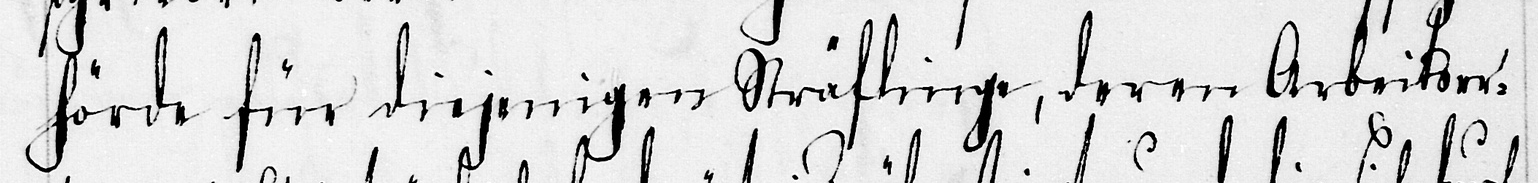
hörde für diejenigen Sträflinge, deren Arbeitsert¬
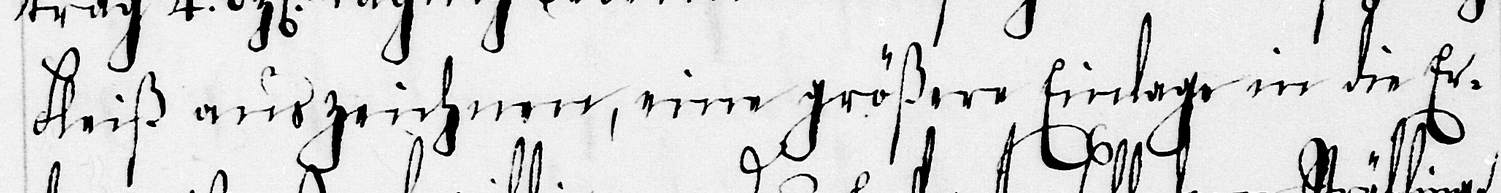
Fleiß auszeichnen, eine größere Einlage in die Er¬
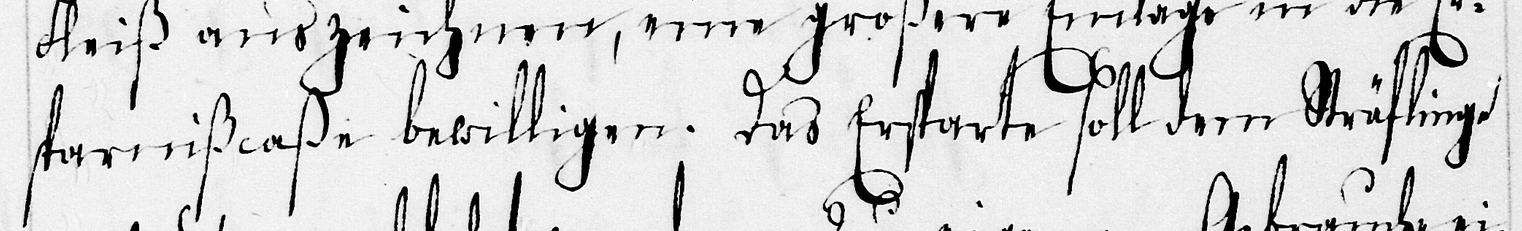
sparnißcaße bewilligen. Das Ersparte soll dem Sträflinge
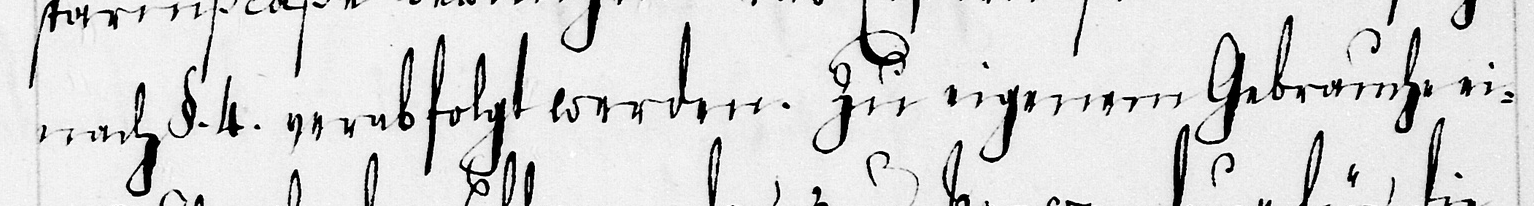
nach §. 4. verabfolgt werden. Zu eigenem Gebrauche ei¬
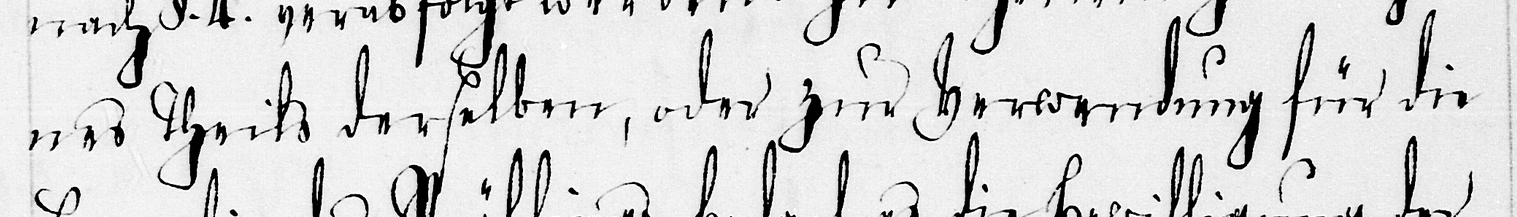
nes Theils derselben, oder zur Verwendung für die
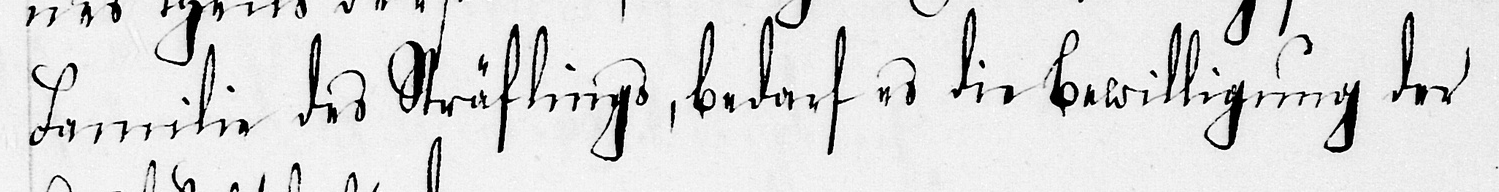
Familie des Sträflings, bedarf es die Bewilligung der
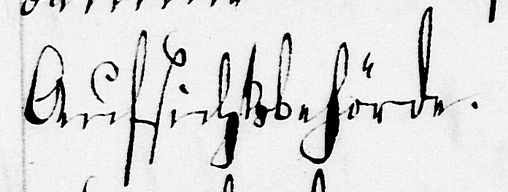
Aufsichtsbehörde.
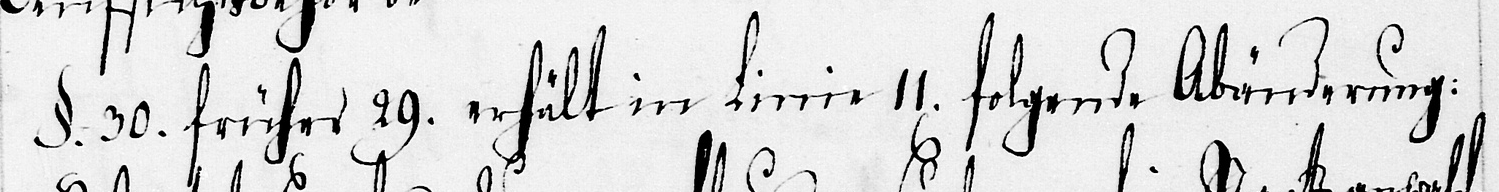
§. 30. früher 29. erhält in Linie 11. folgende Abänderung:
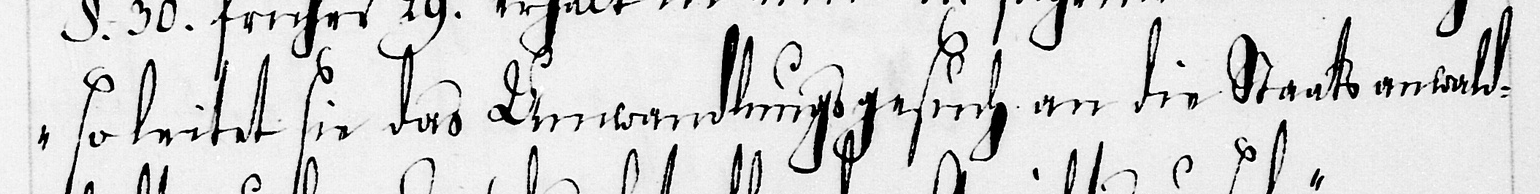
„so leitet sie das Umwandlungsgesuch an die Staatsanwald¬
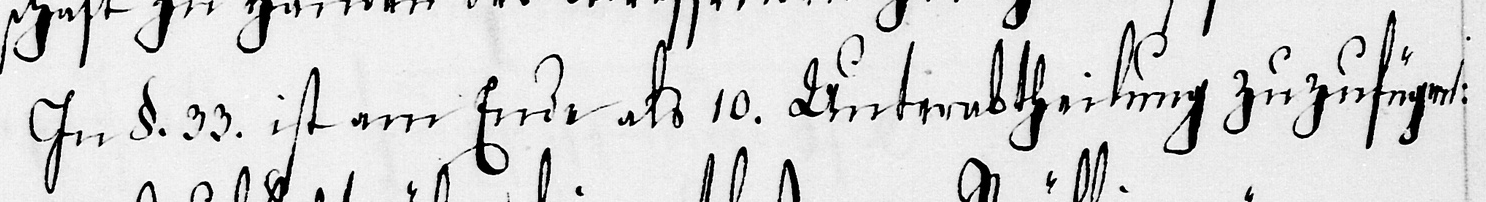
In §. 33. ist am Ende als 10. Unterabtheilung zuzufügen:
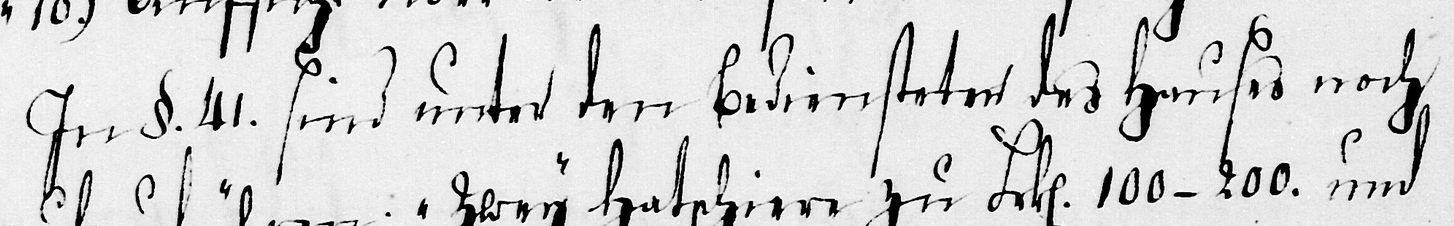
In §. 41. sind unter den Bediensteten des Hauses noch
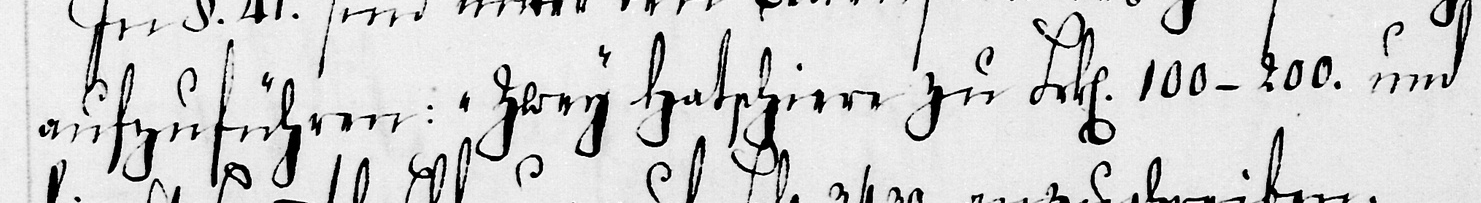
aufzuführen: „Zwey Hatschiere zu Frk[en]. 100–200. und
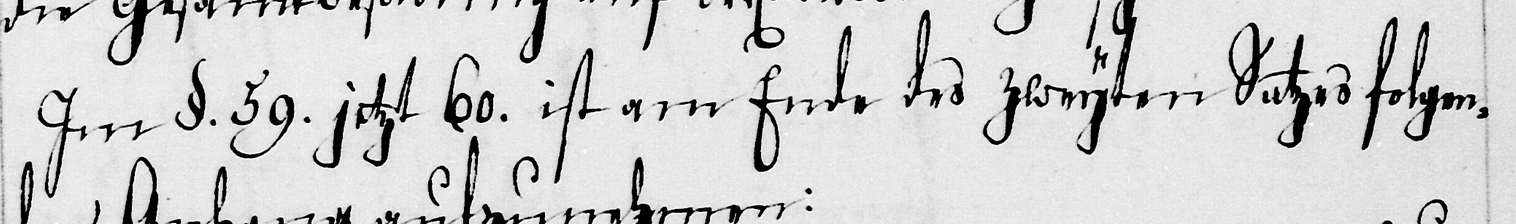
Im §. 59. jetzt 60. ist am Ende des zweyten Satzes folgen¬
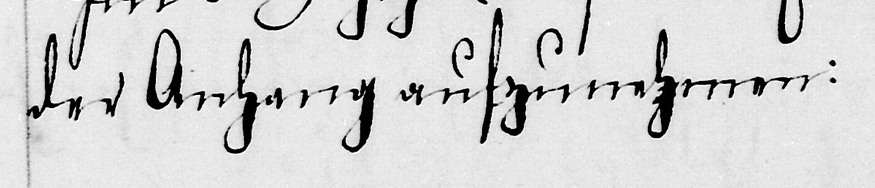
der Anhang aufzunehmen:
